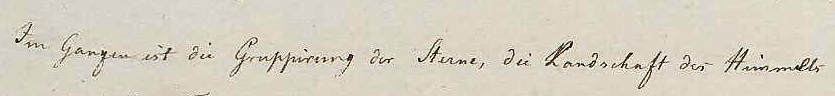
Im Ganzen ist die Gruppirung der Sterne, die Landschaft des Himmels
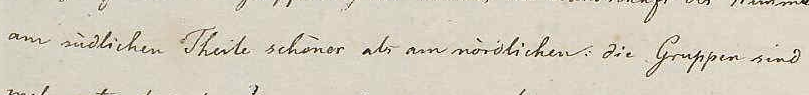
am südlichen Theile schöner als am nördlichen: die Gruppen sind
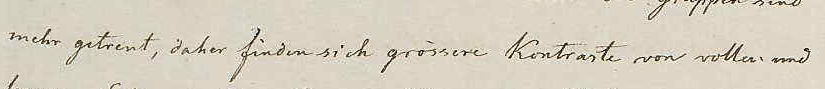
mehr getreut, daher finden sich grössere Kontraste von vollen und
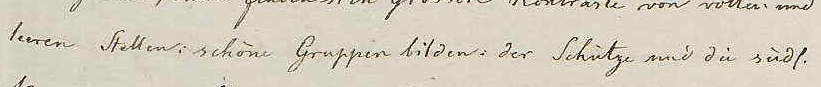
leeren Stellen: schöne Gruppen bilden: der Schütze und die südl.
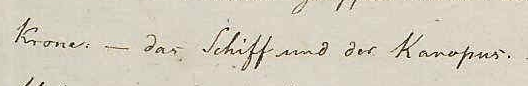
Krone: – das Schiff und der Kanopus. –
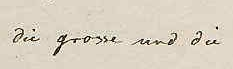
die grosse und die
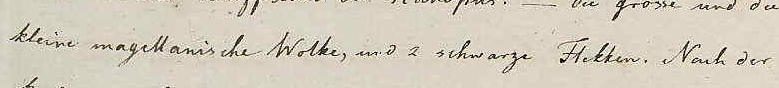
kleine magellanische Wolke, und 2 schwarze Flekken. Nach der
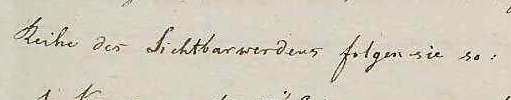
Reihe des Sichtbarwerdens folgen sie so:
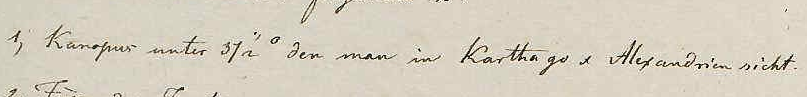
1, Kanopus unter 37½° den man in Karthago & Alexandrien sieht.
